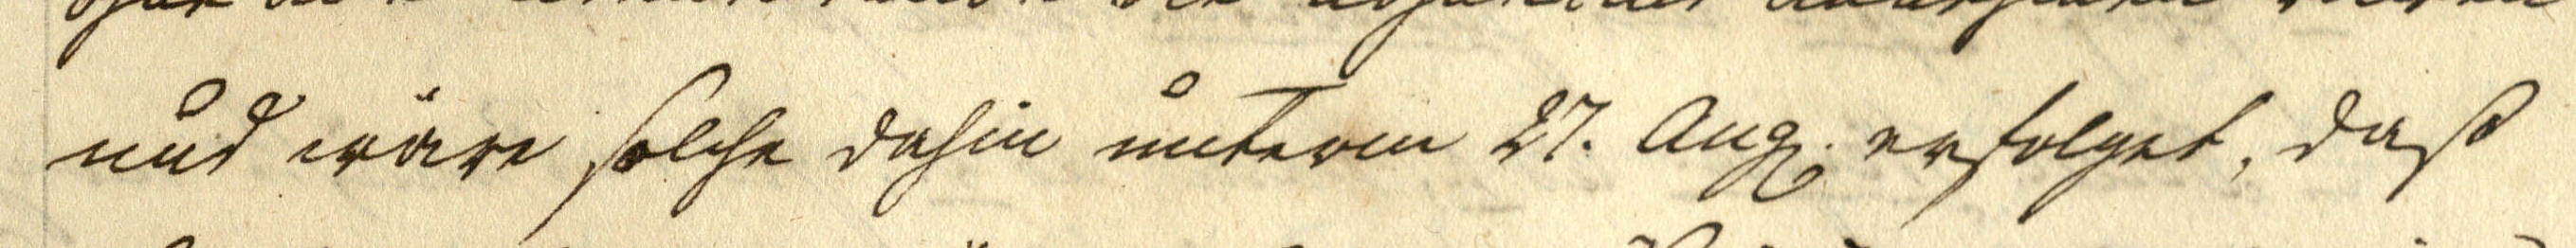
und wäre solche dahin unterm 27. Aug. erfolget, daß
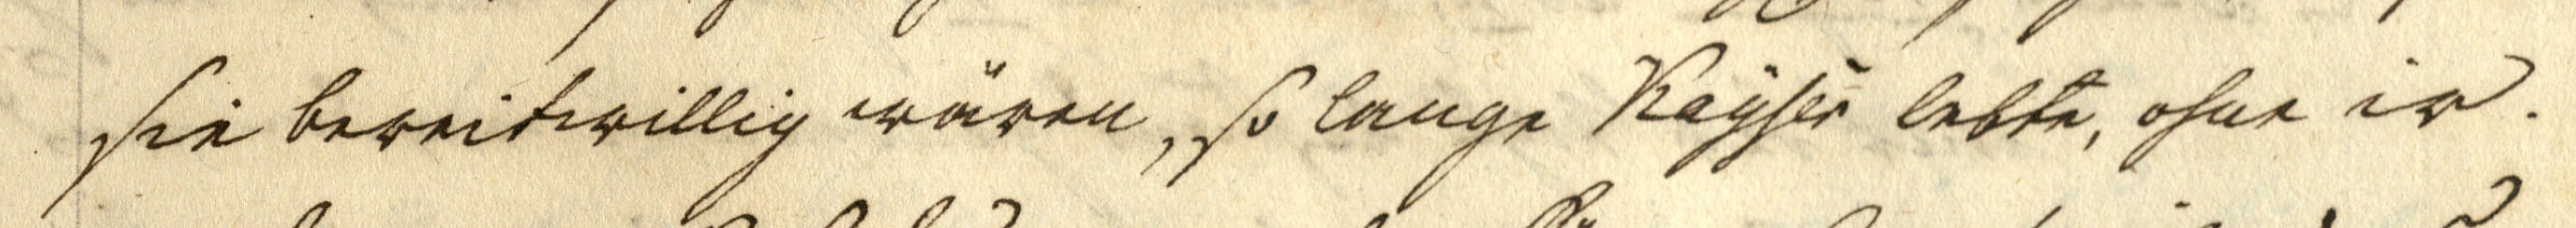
sie bereitwillig wären, so lange Kayser lebte, ohne ir-
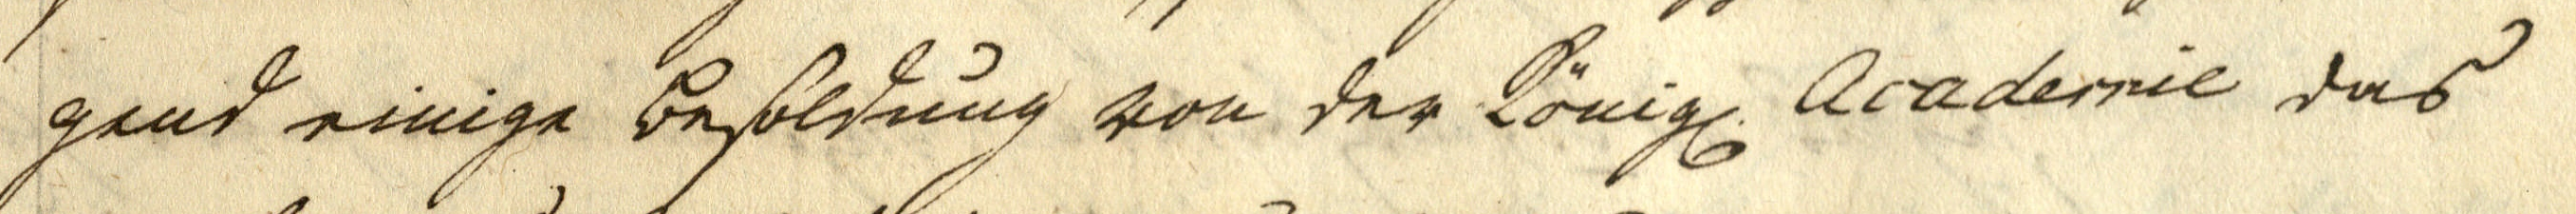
gend einige Besoldung von der Königl. Academie das
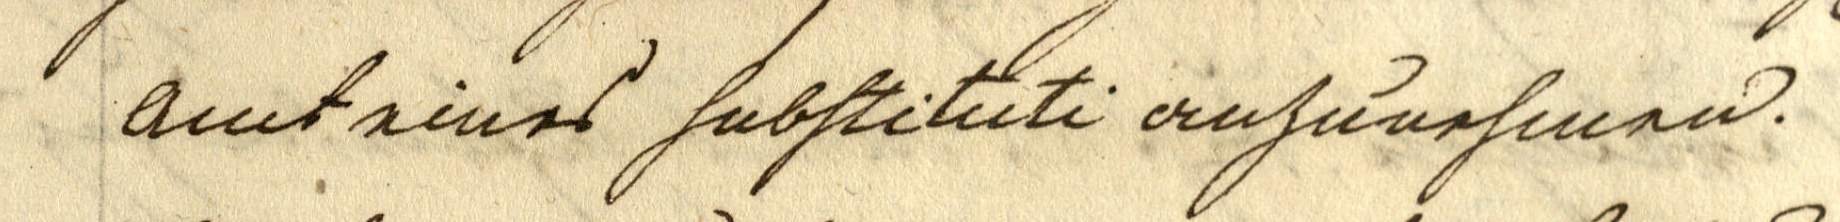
Amt eines substituti anzunehmen.
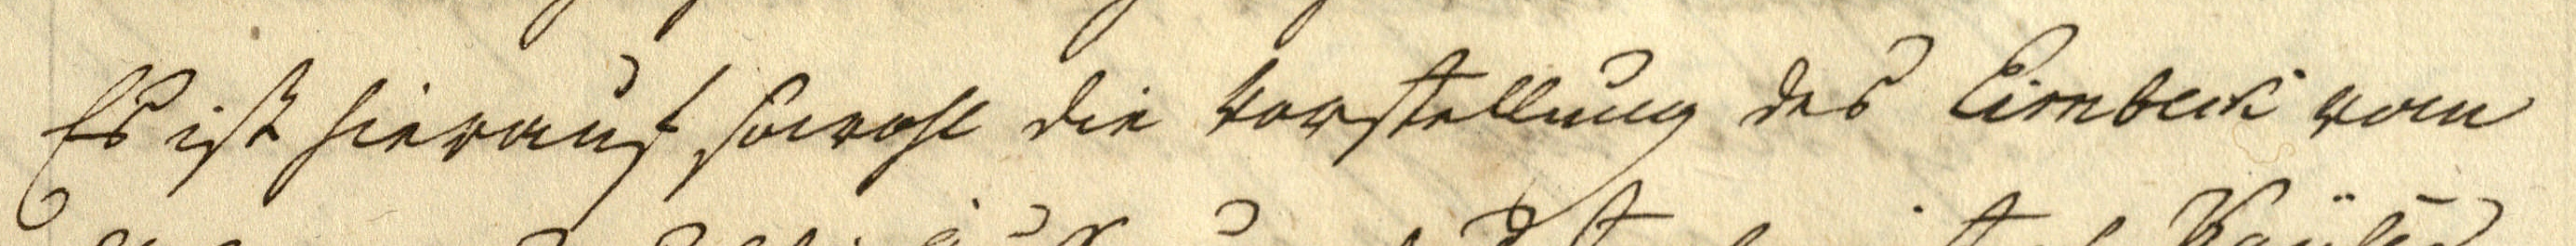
Es ist hierauf sowohl die Vorstellung des Eimbeck vom
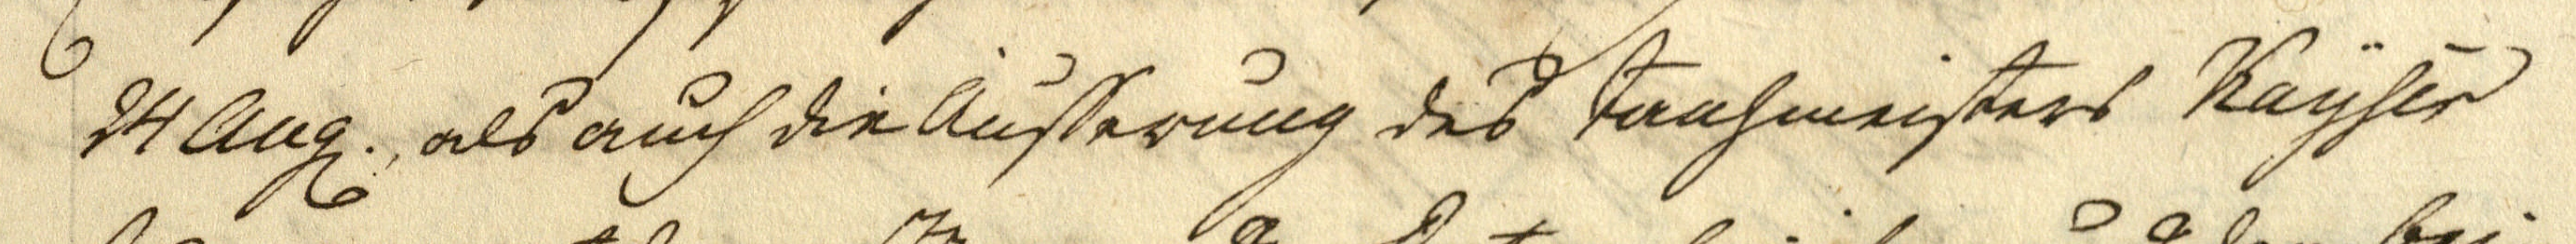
24 Aug., als auch die Äusserung des Tanzmeisters Kayser
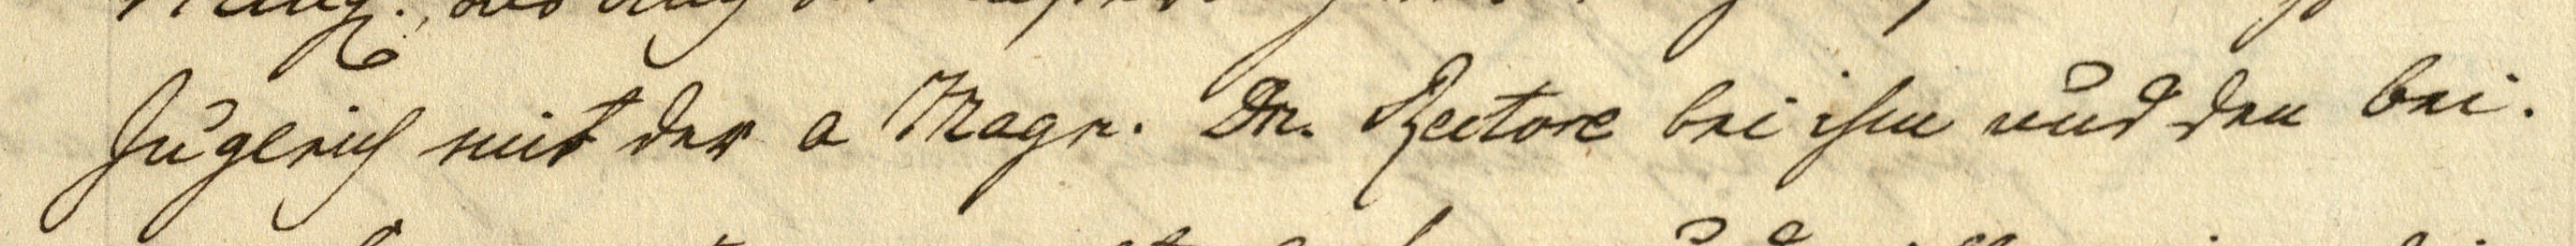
zugleich mit der a Magn. Dn. Rectore bei ihm und den bei-
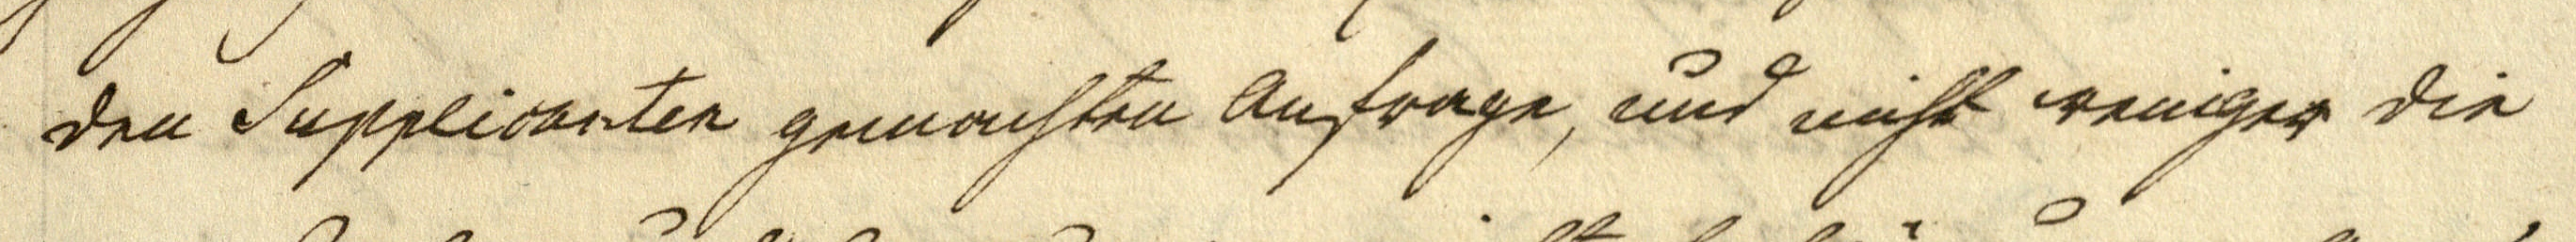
den Supplicanten gemachten Anfrage, und nicht weniger die
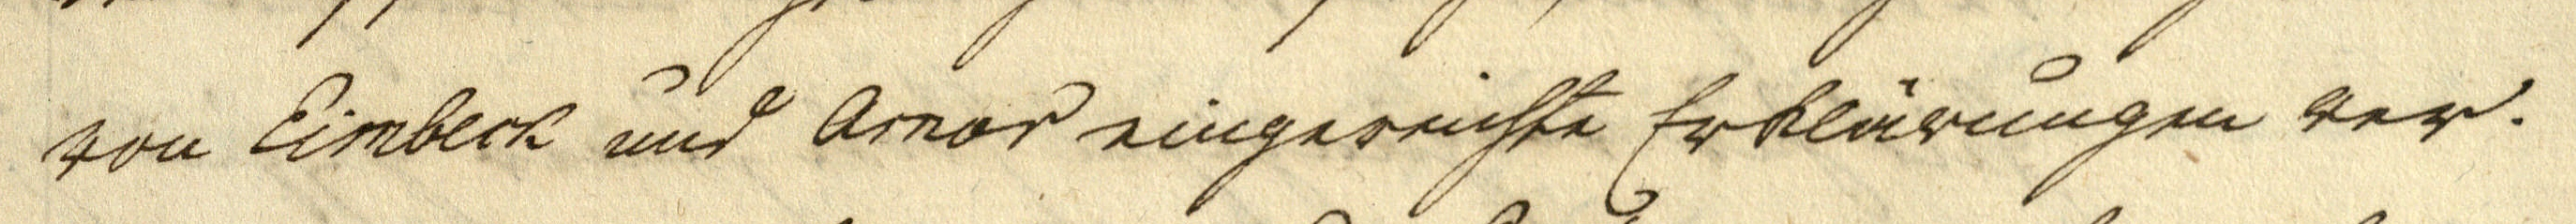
von Eimbeck und Amor eingereichte Erklärungen ver-
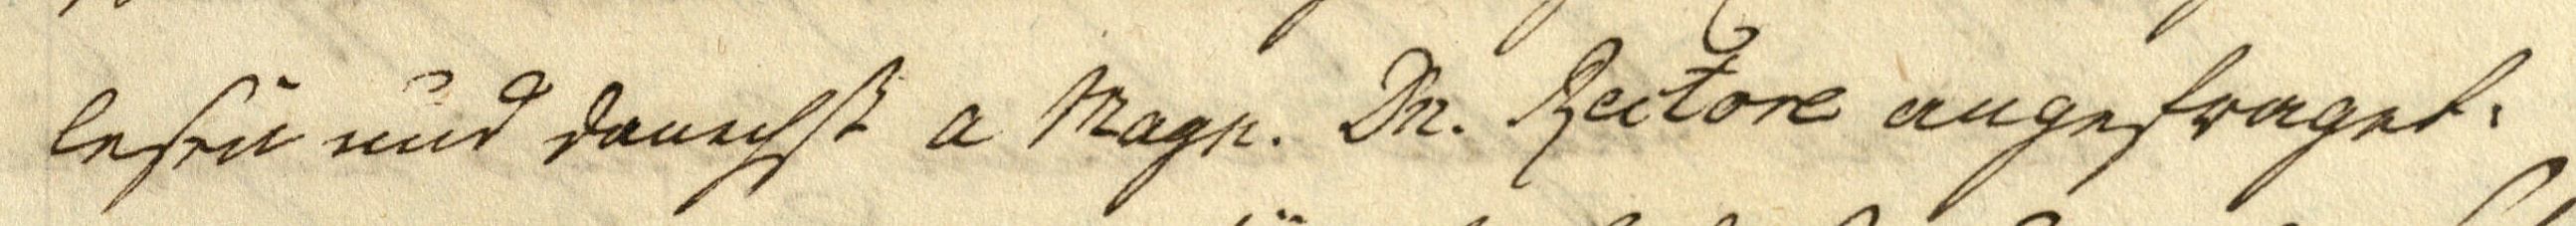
lesen und danechst a Magn. Dn. Rectore angefraget:
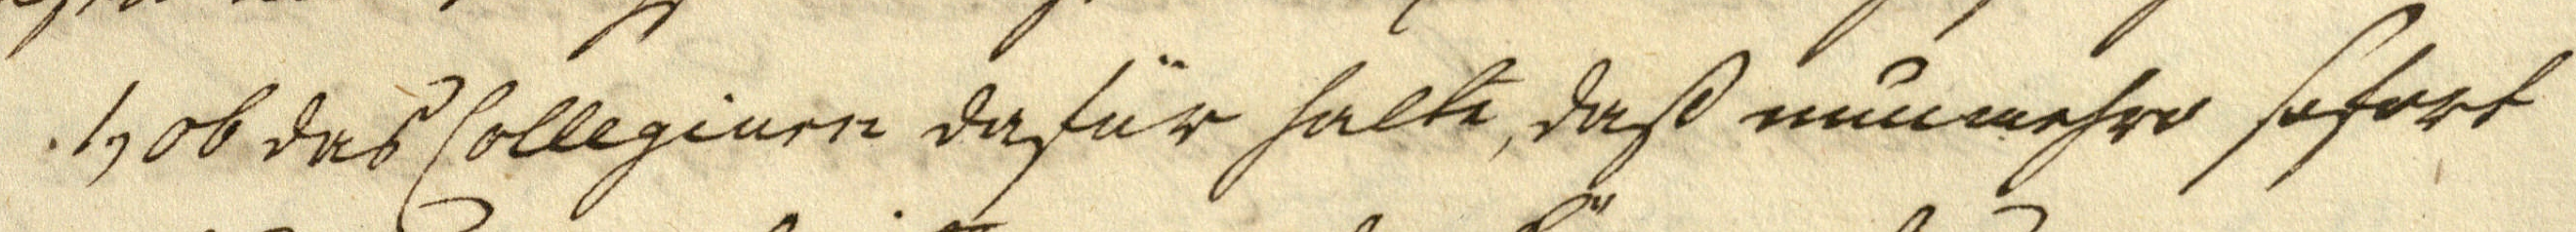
1., ob das Collegium dafür halte, daß nunmehr sofort
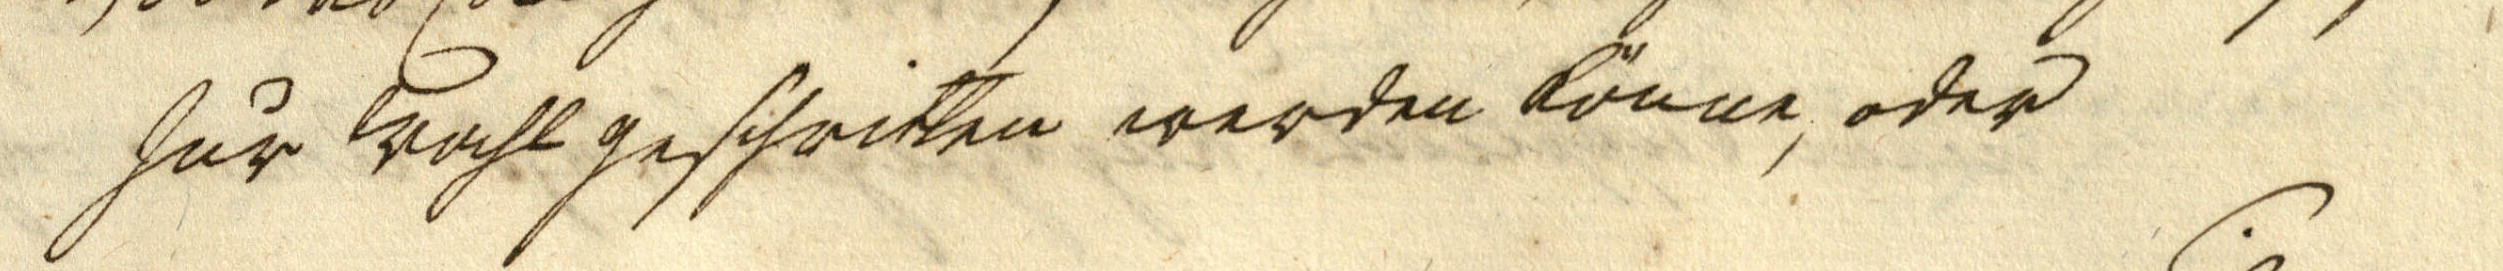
zur Wahl geschritten werden könne, oder
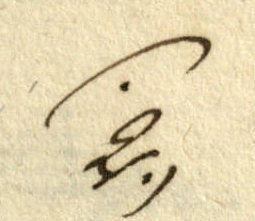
2.)
